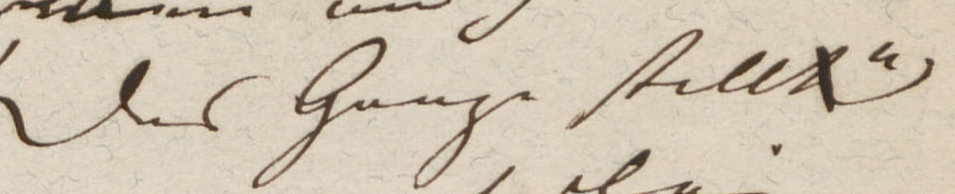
Das Ganze stellte
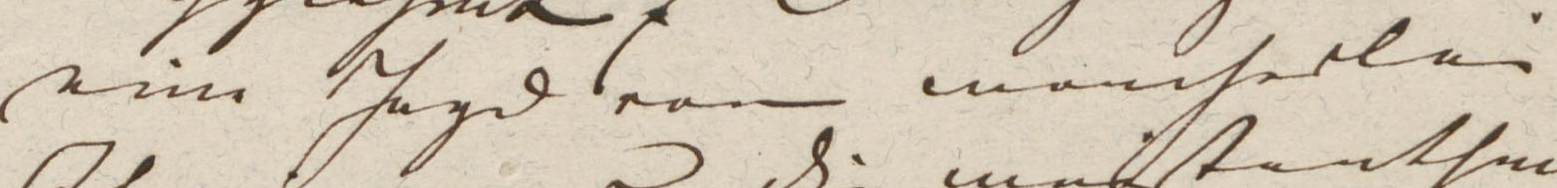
"eine Jagd von mancherlei
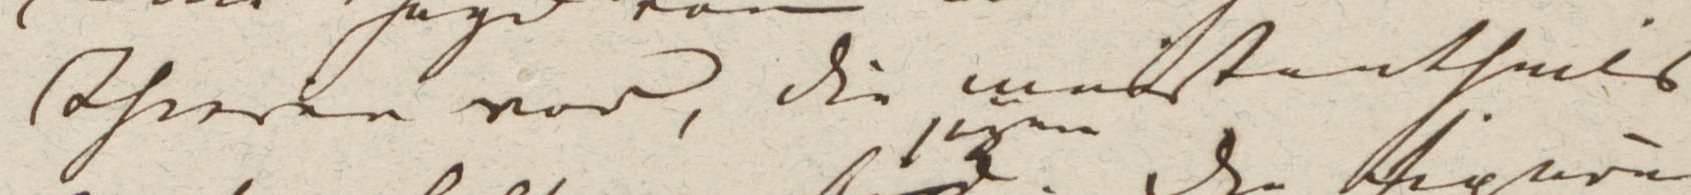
"Thieren vor, die meistentheils
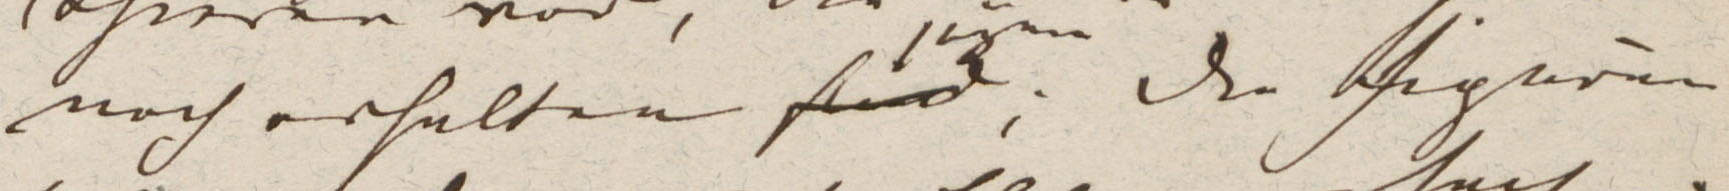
"noch erhalten sind seyen; Die Figuren
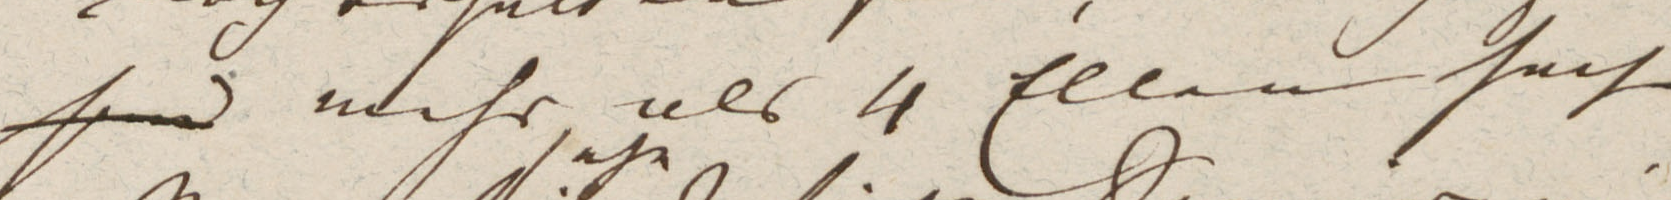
sind mehr als 4 Ellen hoch;
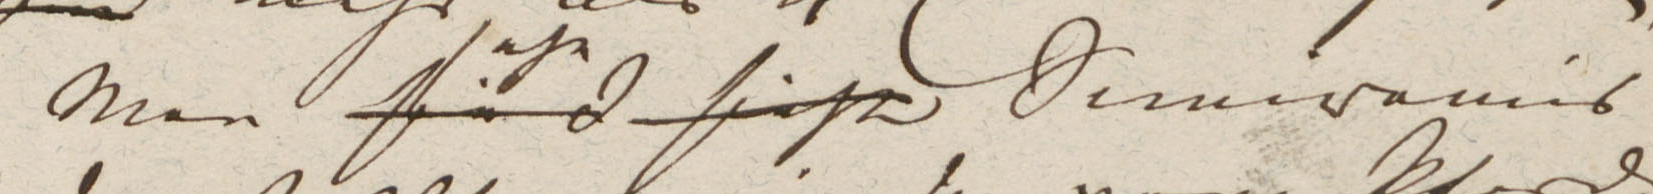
"Man sie d sieht sehe Semiramis
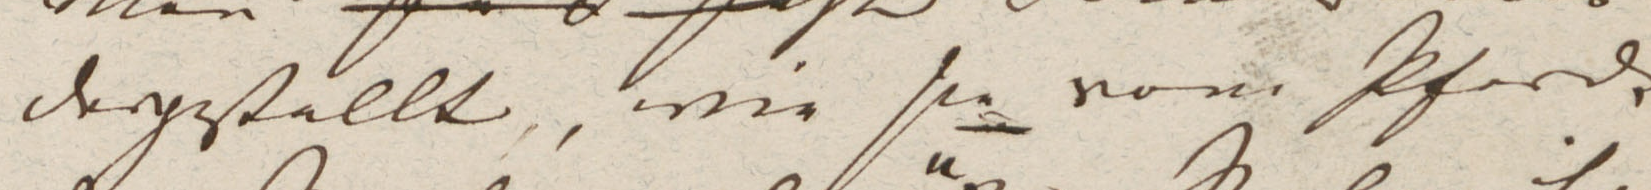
"dargestellt, wie sie vom Pferde
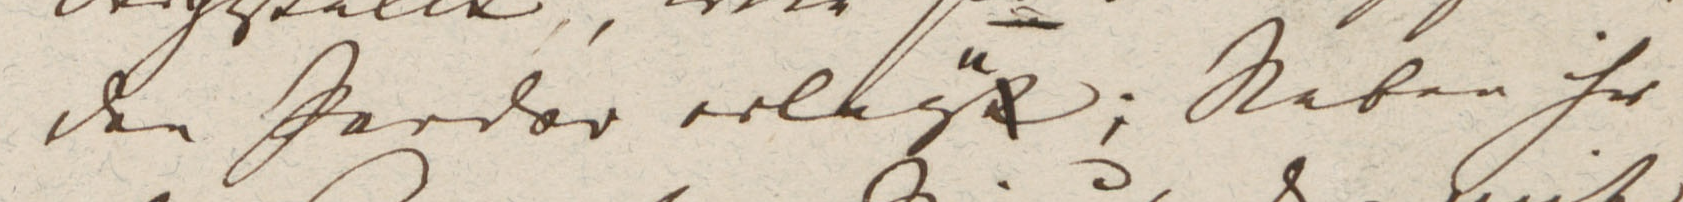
"den erlegte; Neben ihr
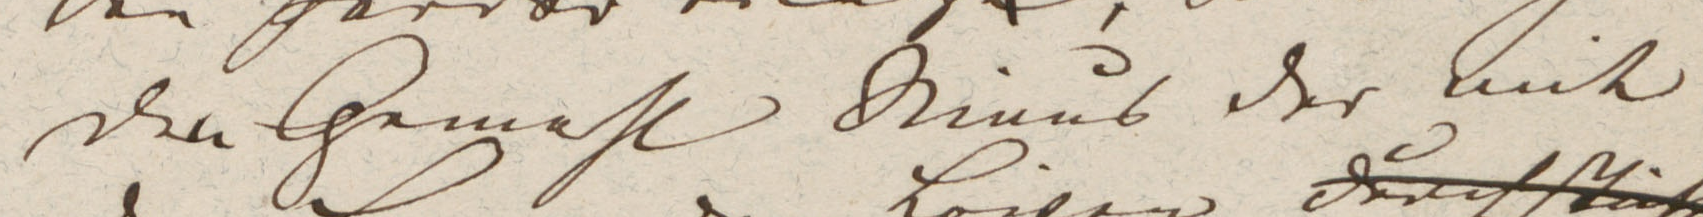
"de Gemahl Ninus der mit
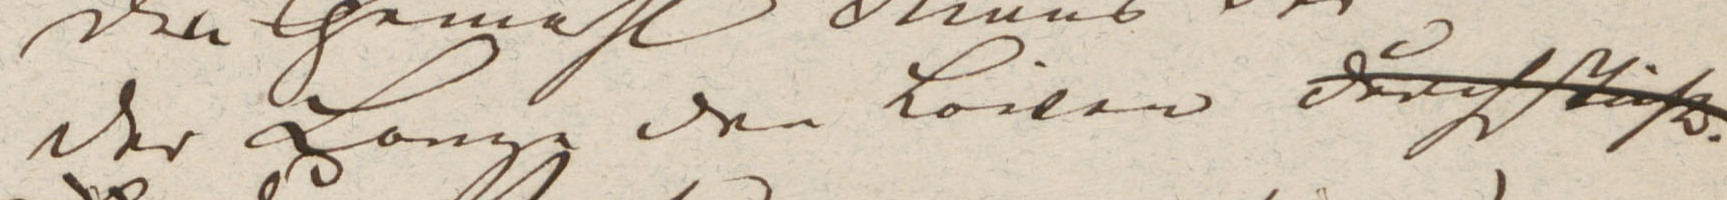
"der Lanze den Löwen durchsticht.
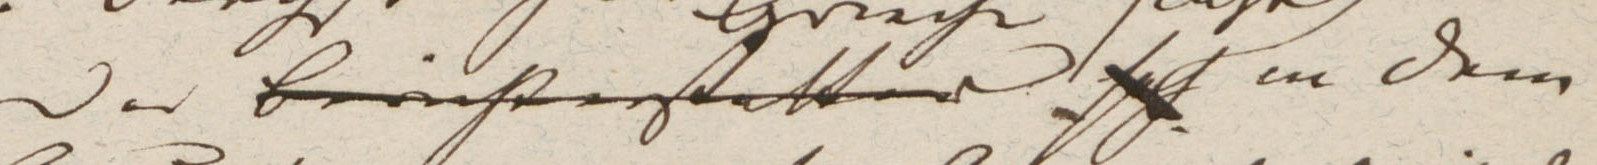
Der Berichterstatter Grieche sieht sich in dem
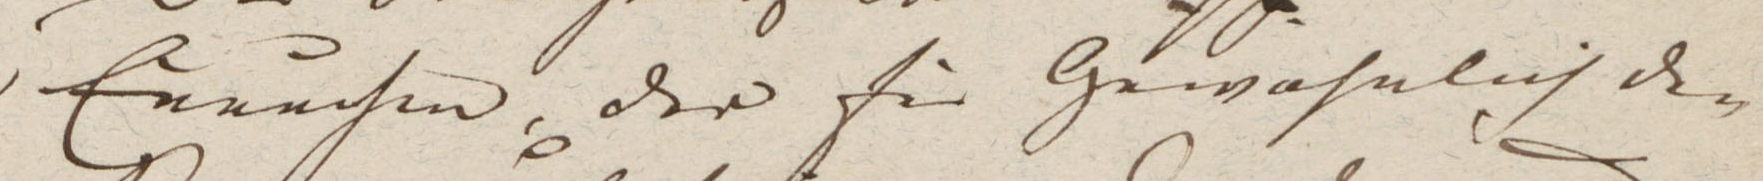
Eunuchen, der für ewöhnlich den
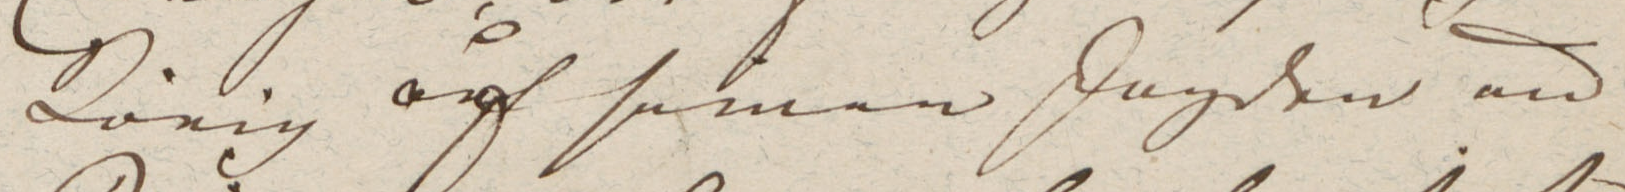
König auf seinen Jagden und
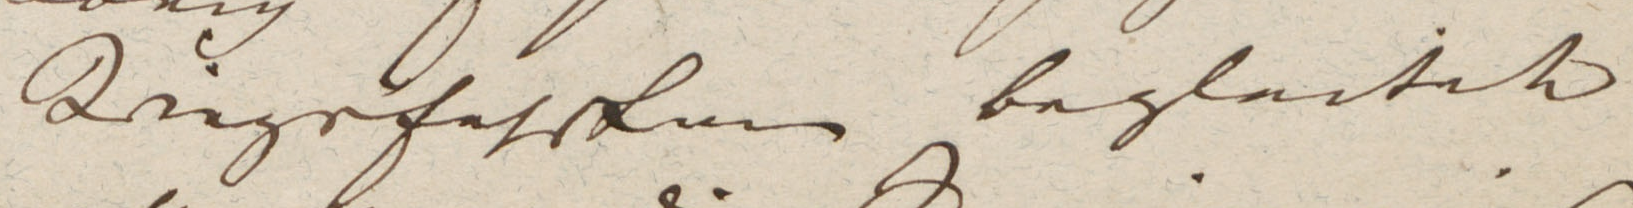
Kriegsfahrten begleitet
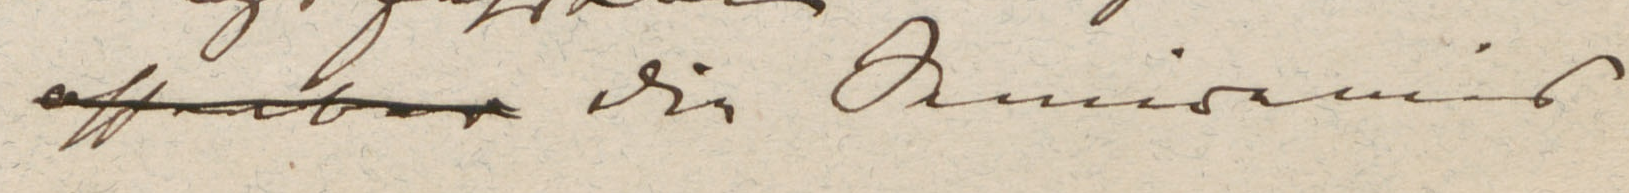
offenbar die Semiramis
